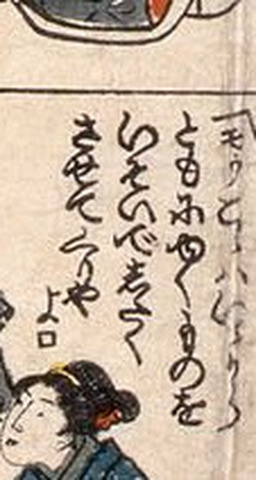いそいでしたく
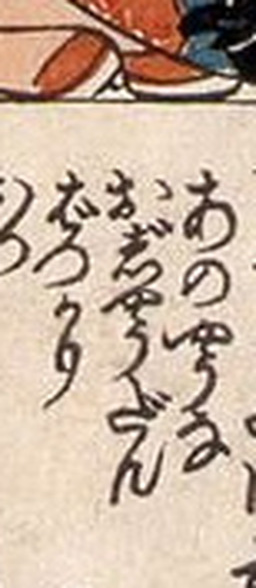ばつかり
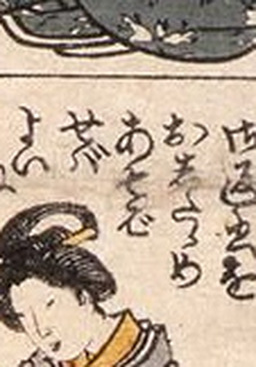あそば
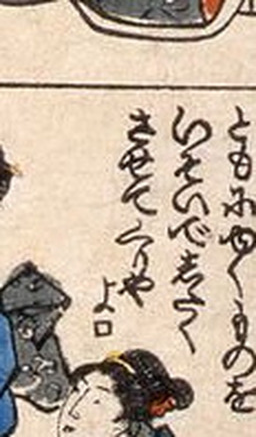させてくりや
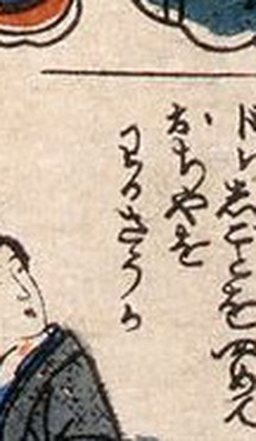わかさうか
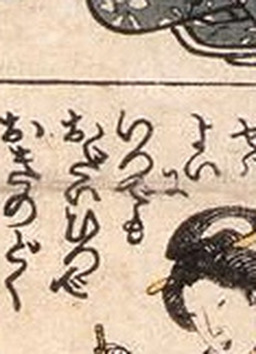いつでも
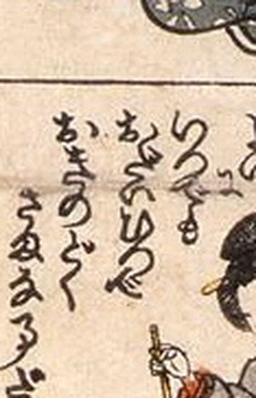おだいひつで
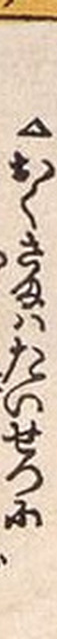△おくさまはたいせつに
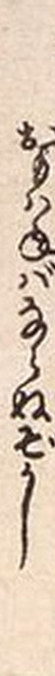おもはねばならぬぞかし
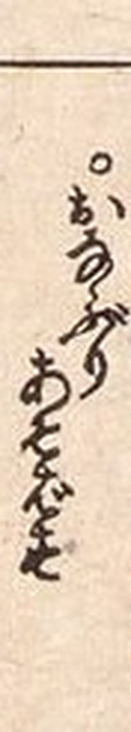○おなぶりあそばす
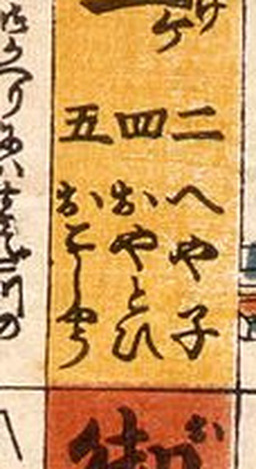二おやとひ
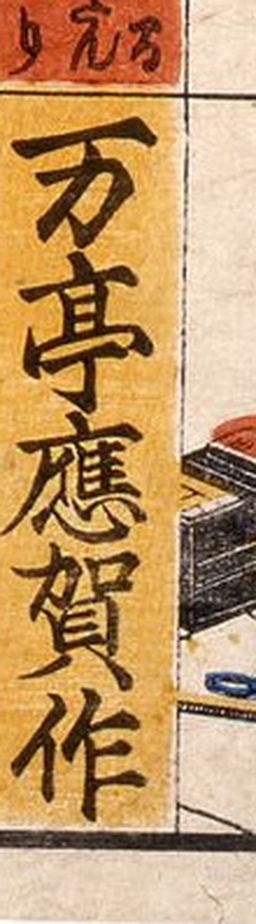万亭応賀作
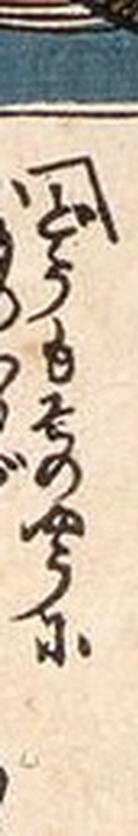〽どうもそのやうに
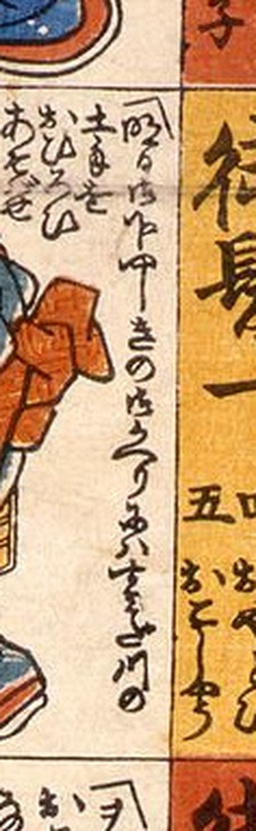〽明日御下やしきの御かへりにはすみだ川の
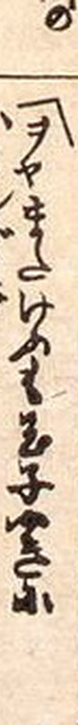〽ヲヤまたけふも玉子やきに
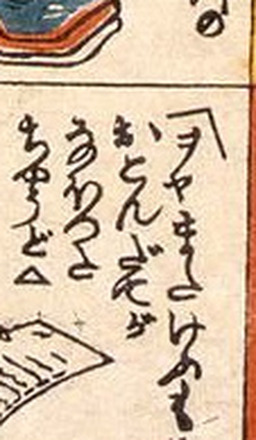おこんだてが
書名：奥奉公出世双六
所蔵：東京学芸大学教育コンテンツアーカイブ
